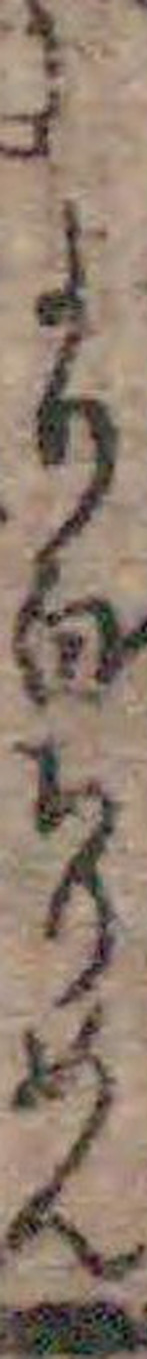より白ちりめん
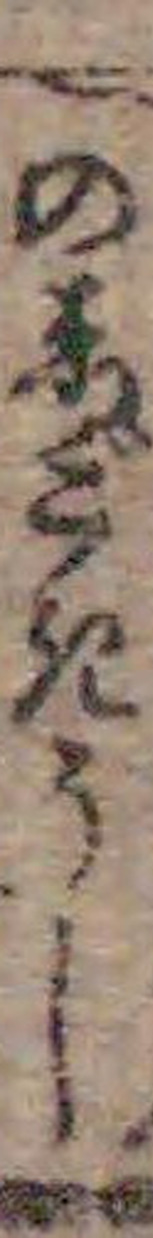のしごきうし
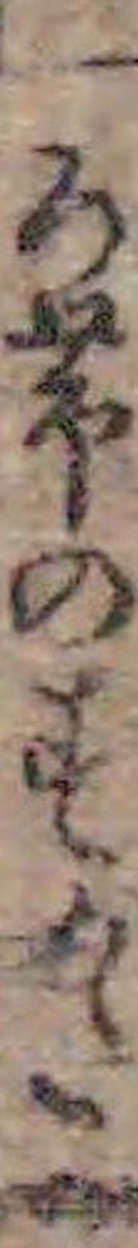ろ帯のすがた
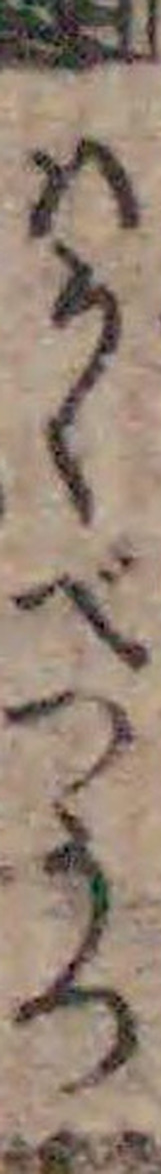はかくべつうつ
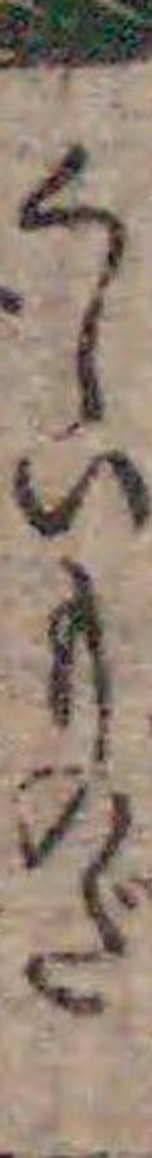くしいものだ
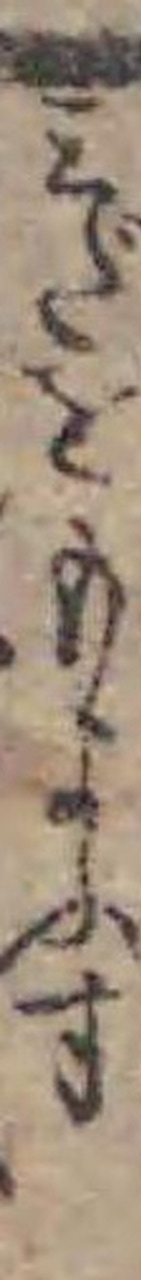みだをもよふし
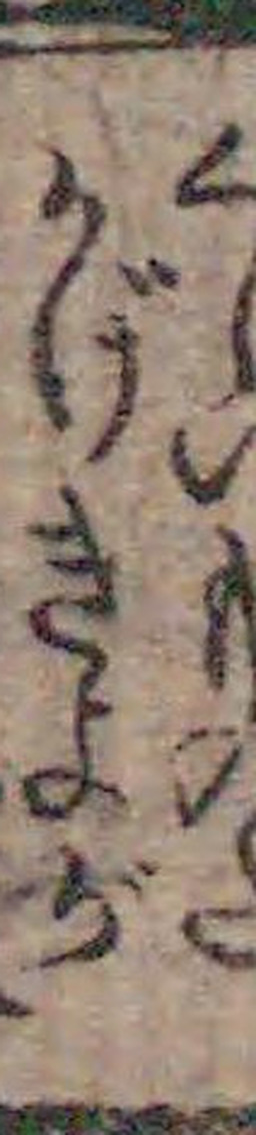かげきよが
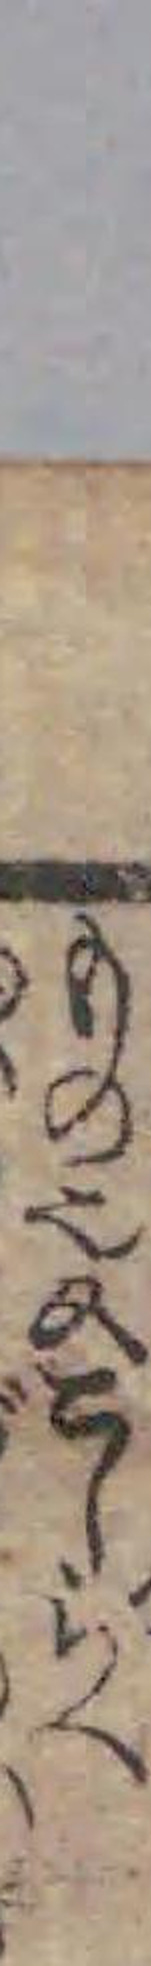もの也又こしらへ
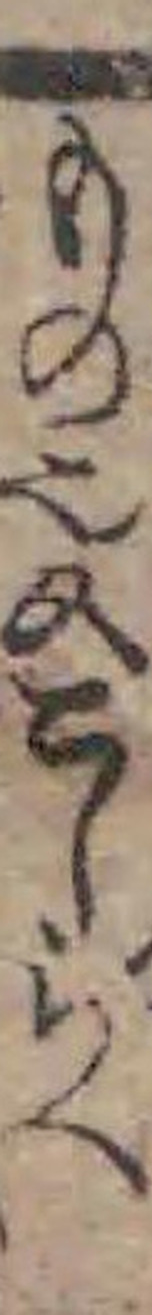もの也又こしらへ
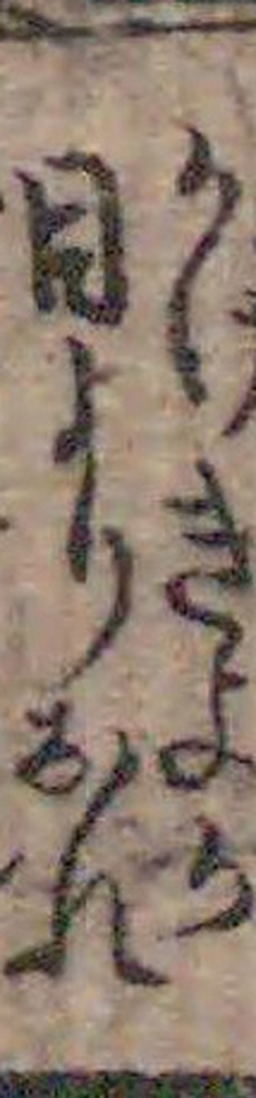目よりおれ
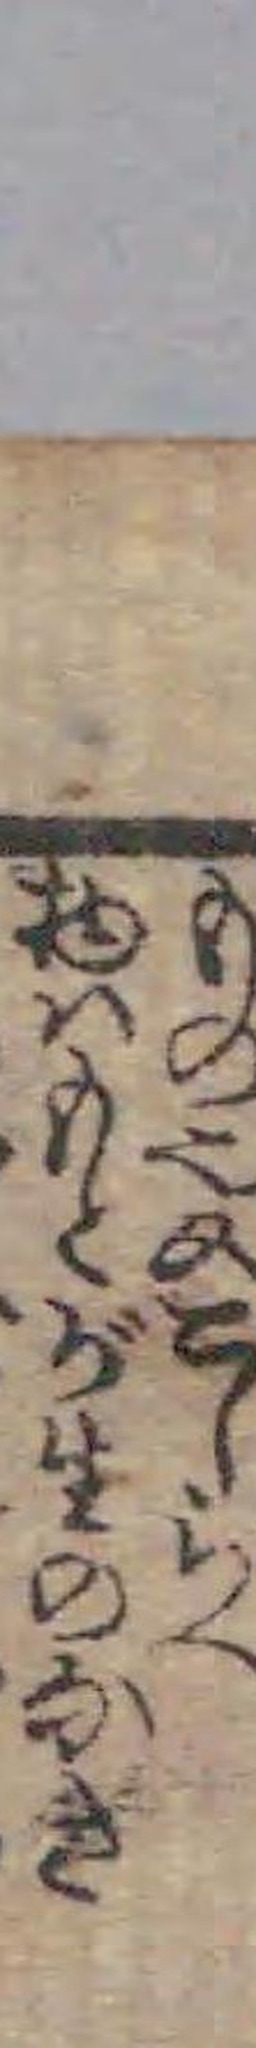物はもとが生のなき
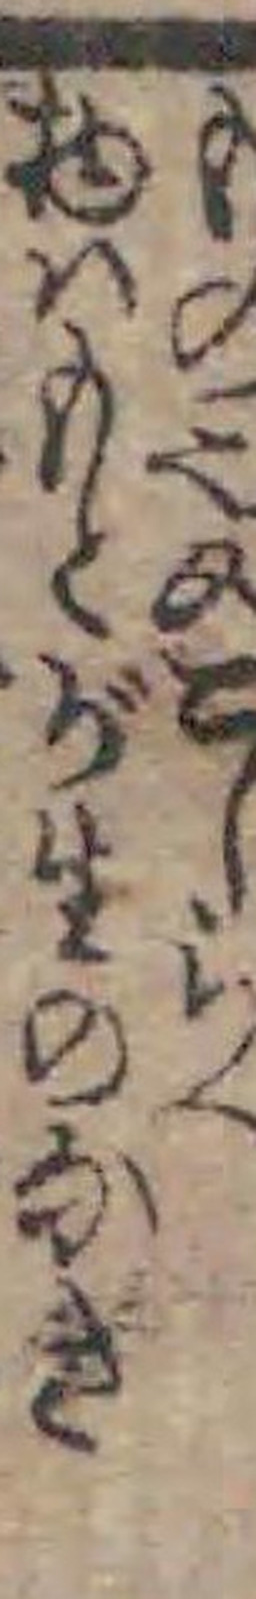物はもとが生のなき
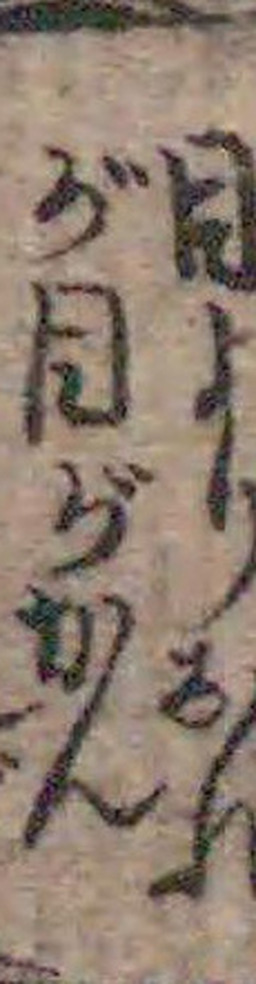が目がかん
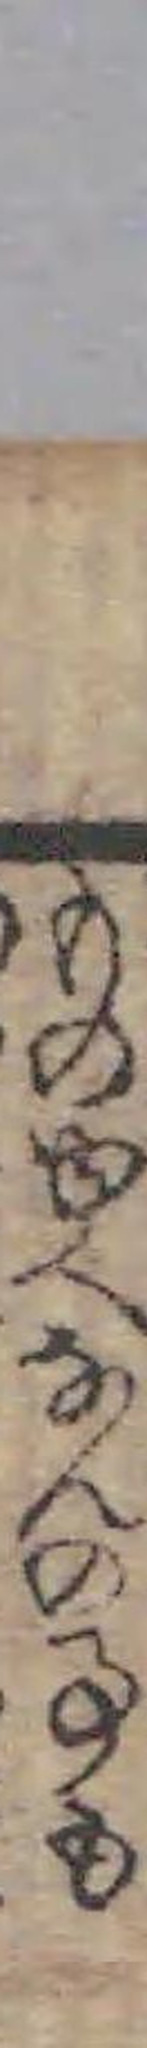ものゆへなんの事も
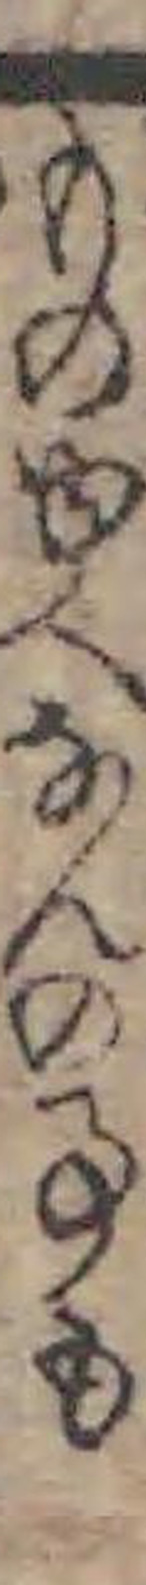ものゆへなんの事も
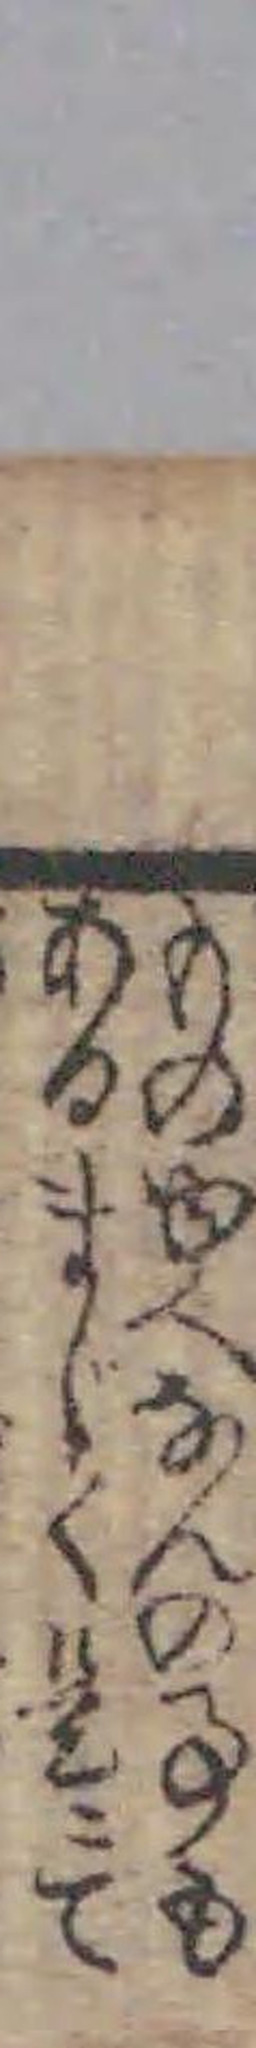あるまじく是にて
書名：悪七変目景清 : 2巻
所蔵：国立国会図書館 National Diet Library, JAPAN
